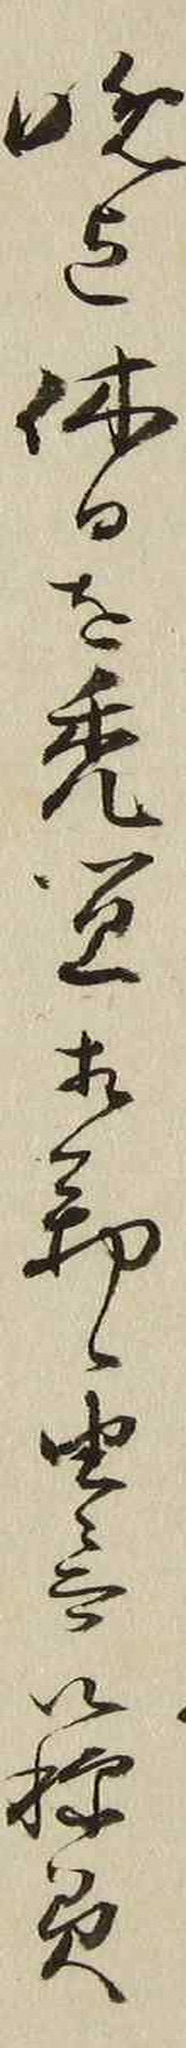晩迄休日を禿宜相勤候由ニ而御称美
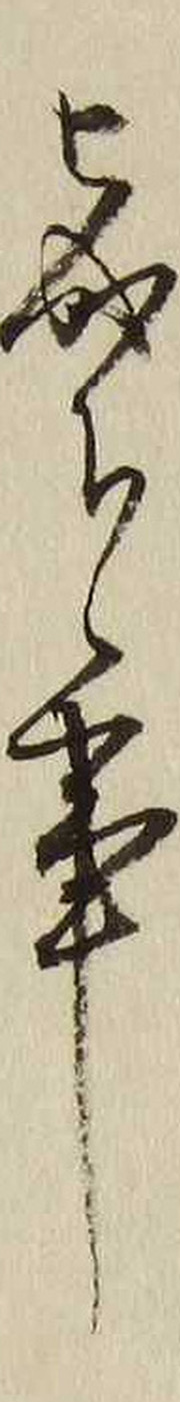被成下候事
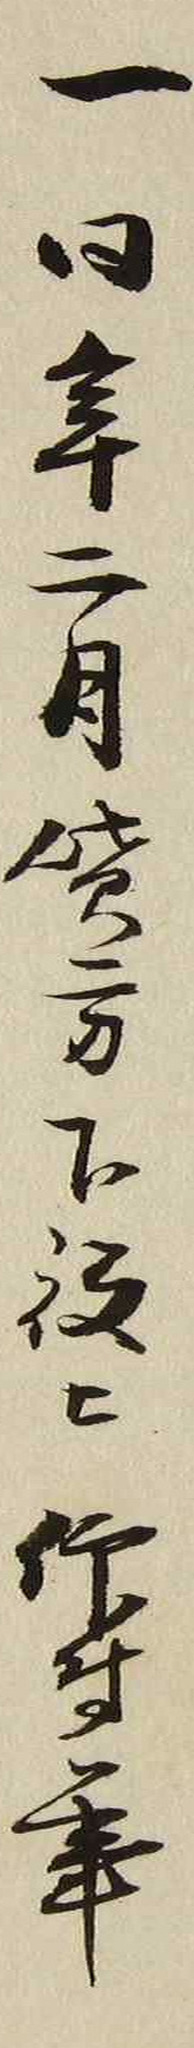一同年二月貸方下役被仰付候事
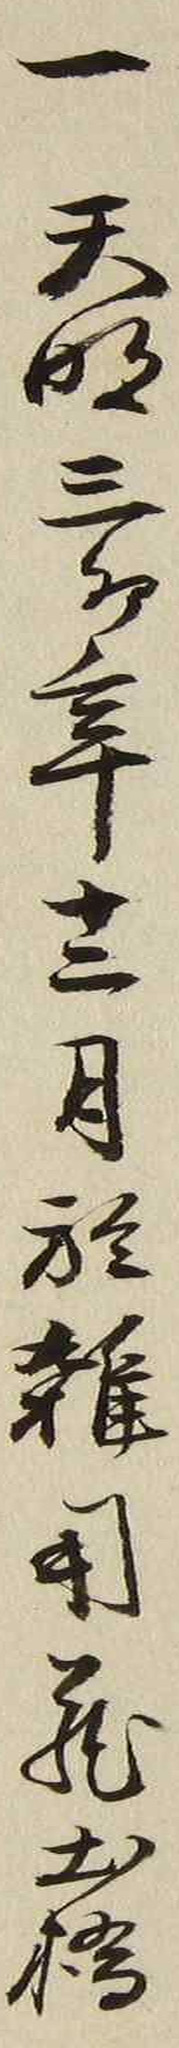一天明三卯年十二月於雑用蔵土橋
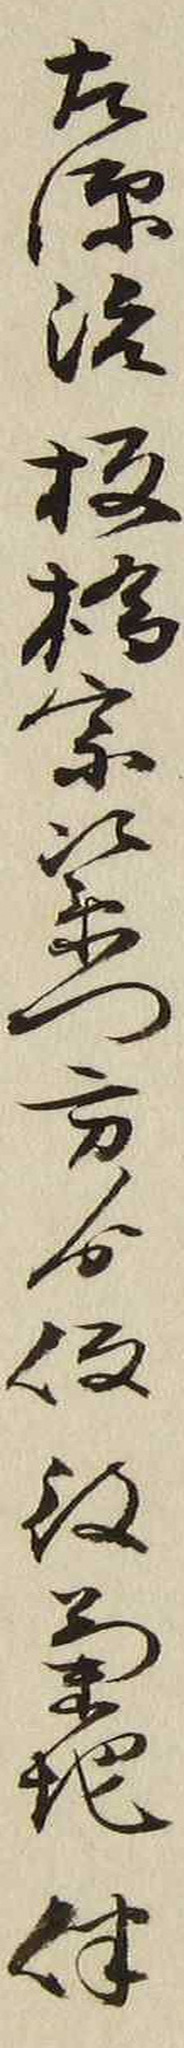左源治板橋宗次衛門方ゟ仮役菊地伴
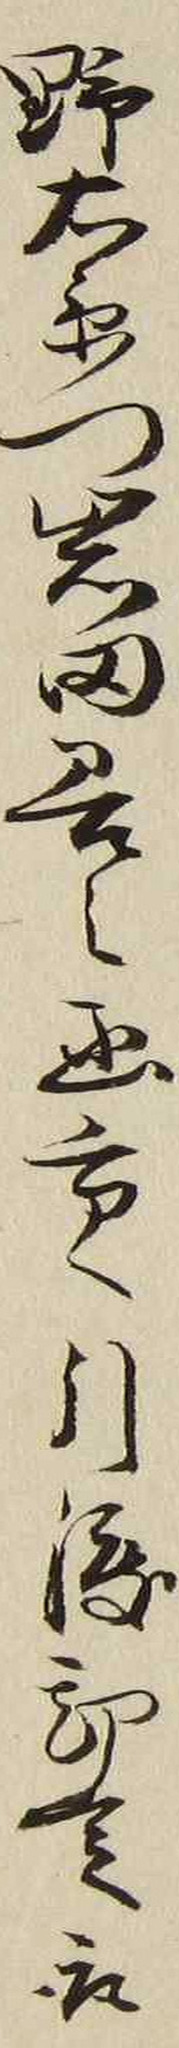野右衛門岩田善之丞方へ引渡勘定取
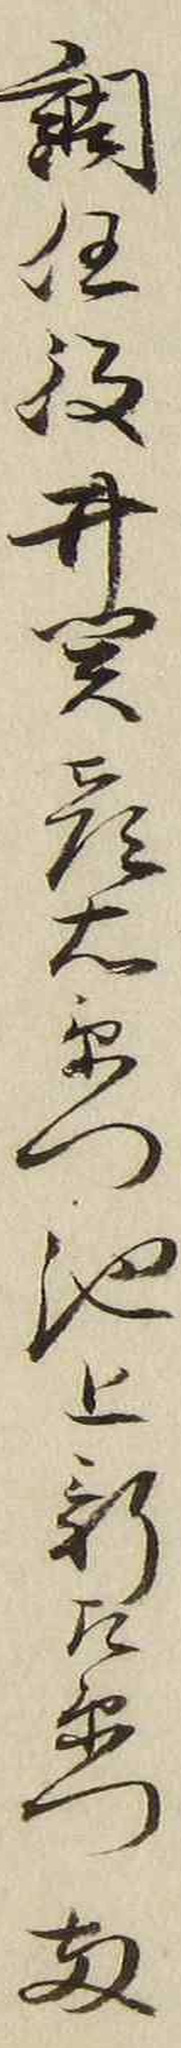調任役井関彦右衛門池上新左衛門両

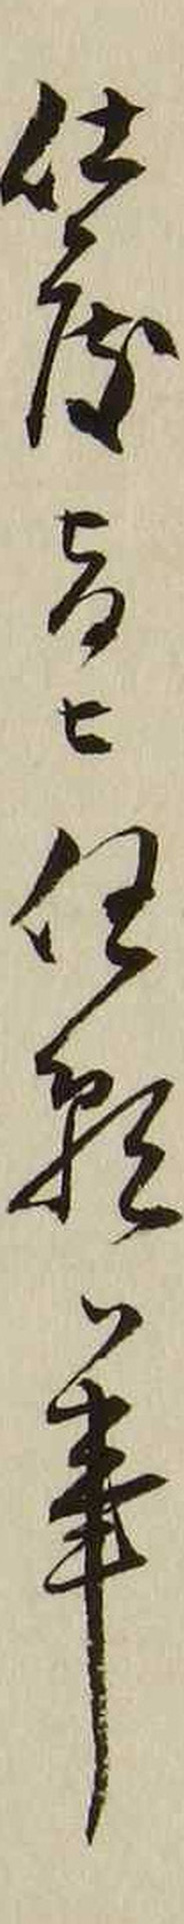仕度旨被任願候事
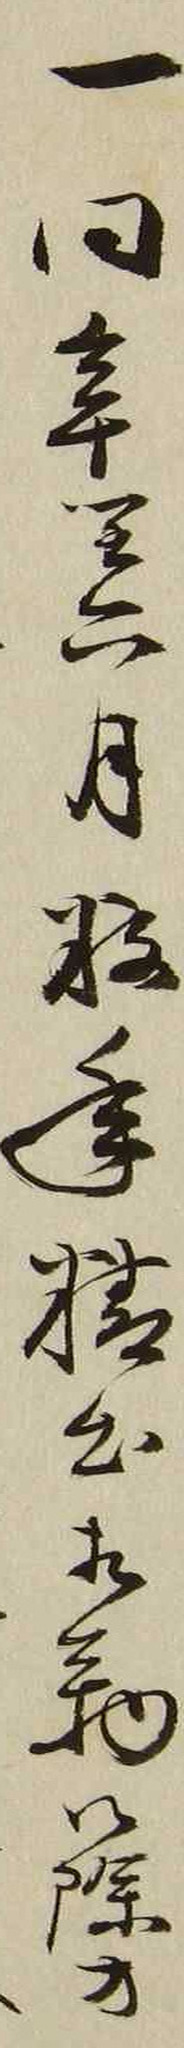一同年閏六月数年精出相勤御除方
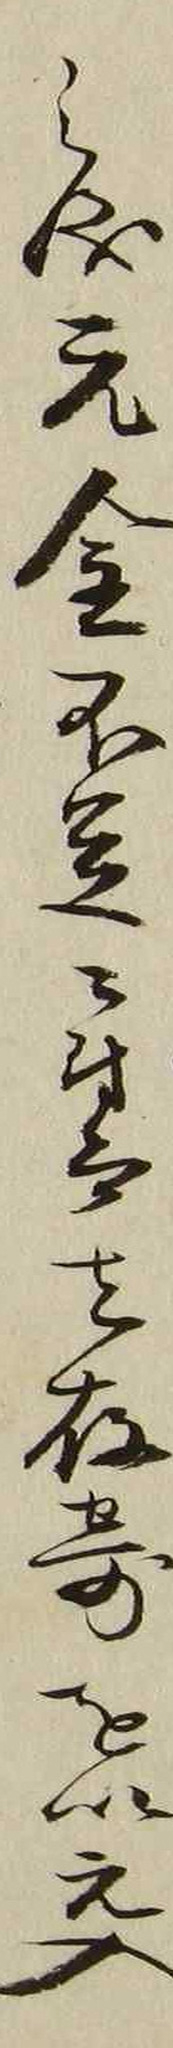之儀元金不足ニ付而は存寄を以元入
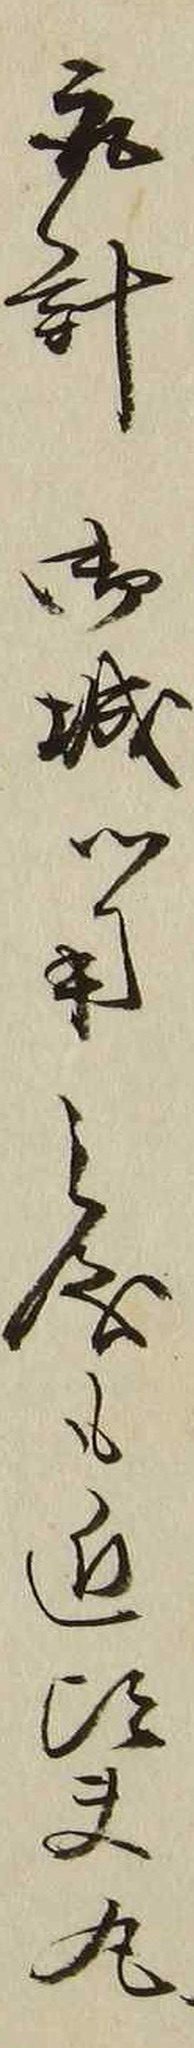取計御城御用之儀も近頃夫丸
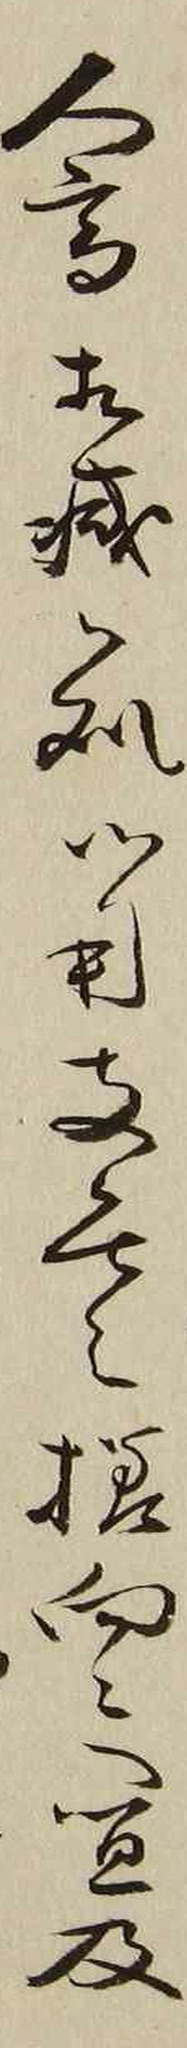人高相減候処御用支無之様向々へ宜及
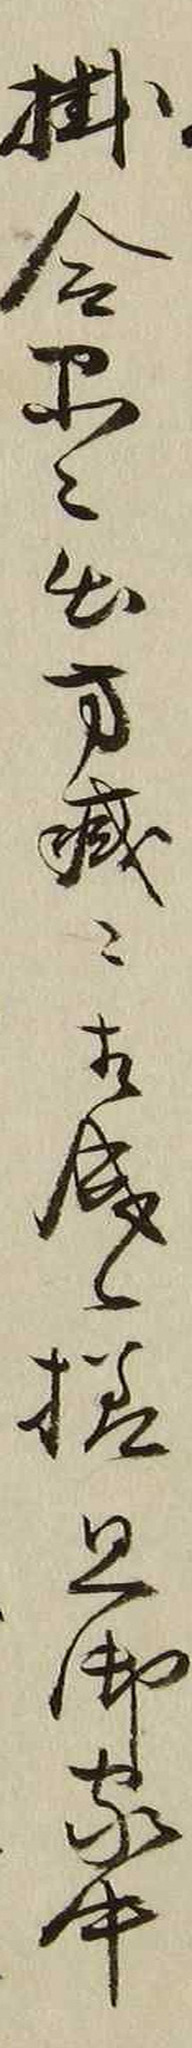掛合品ニ出方減ニ相成候様且御家中
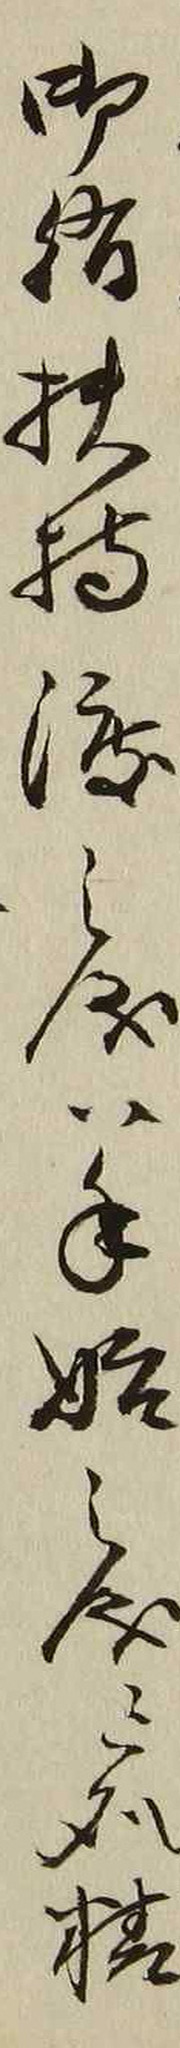御賄扶持渡之儀御手始之儀ニ候処精
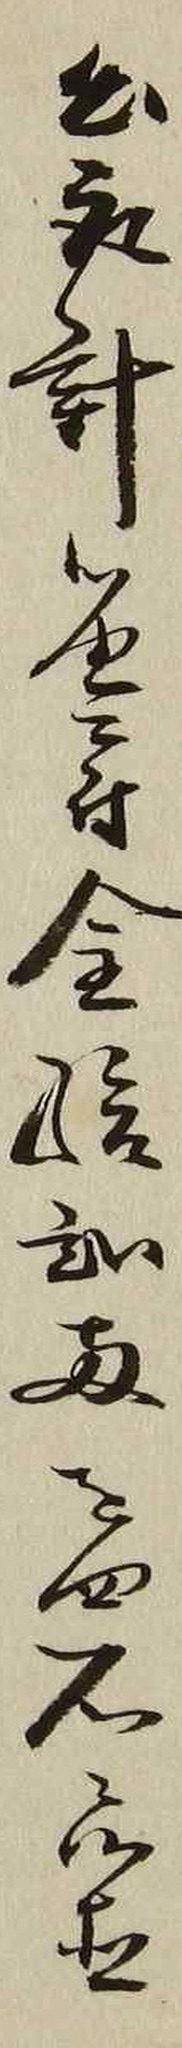出取計候由ニ付金拾弐両を四石ニ御直
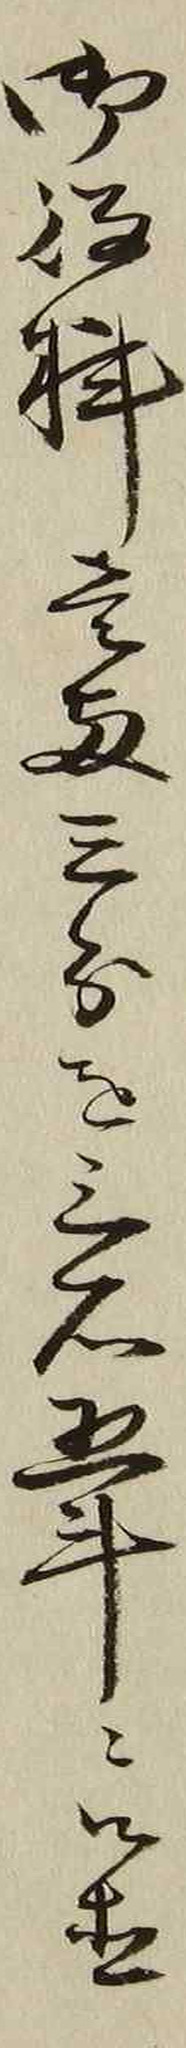御役料壱両三分を三石五斗ニ御直
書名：諸士系譜　巻之291　さ之部23
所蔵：会津若松市立会津図書館
